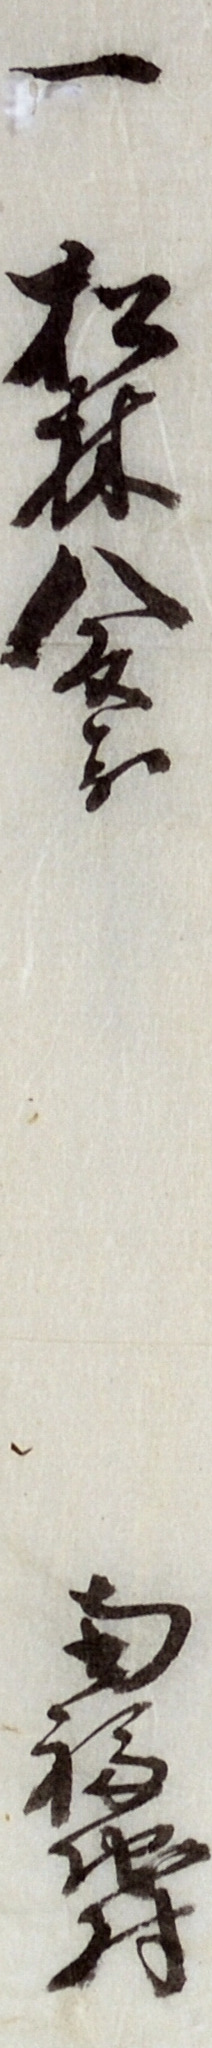一松林八反歩南福地村
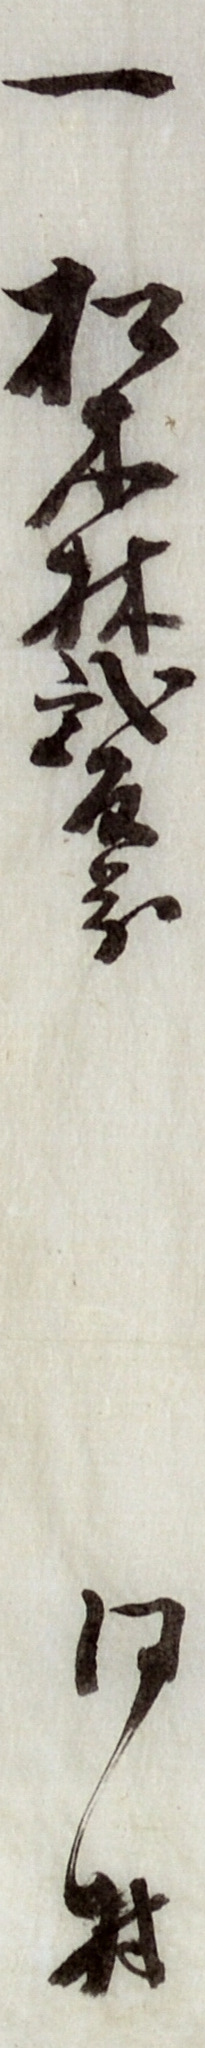一松木林弐反歩同村

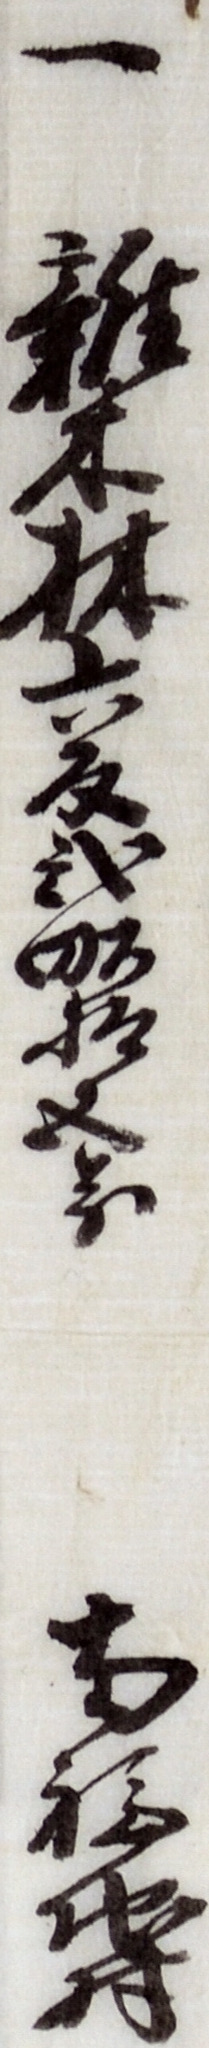一雑木林六反弐畝拾五歩南福地村
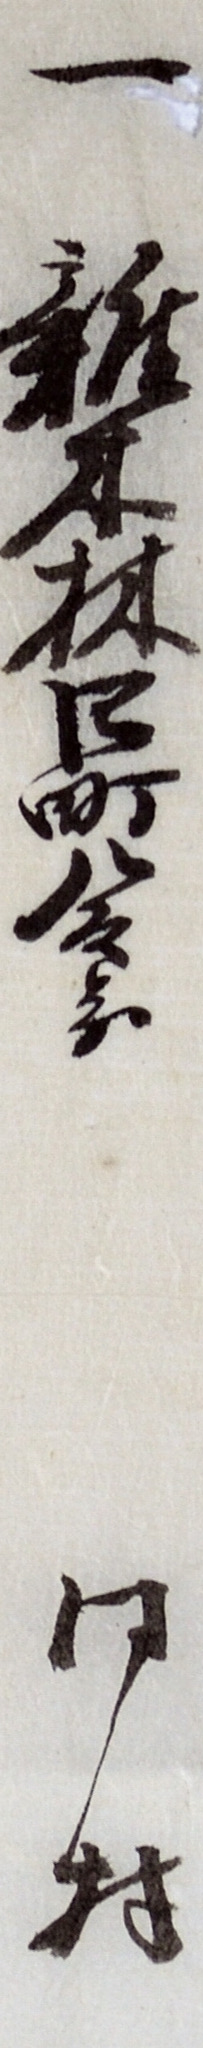一雑木林四町八反歩同村
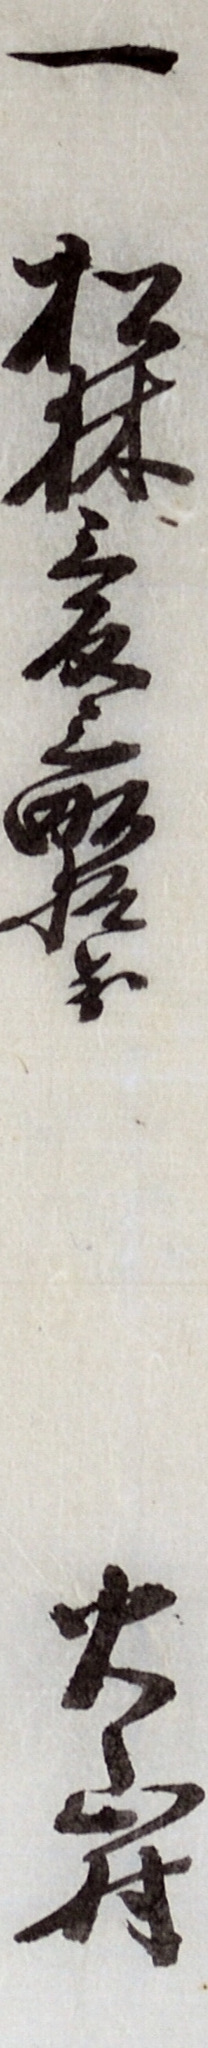一松林三反三畝拾歩火山村
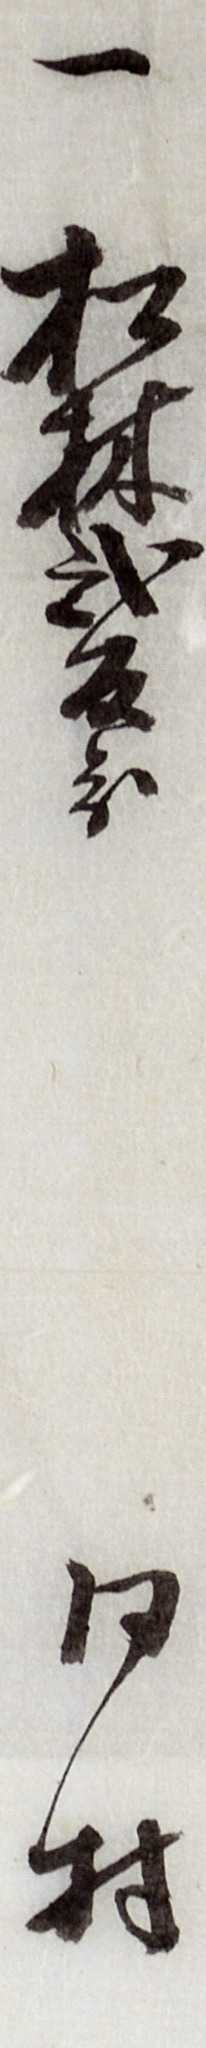一松林弐反歩同村
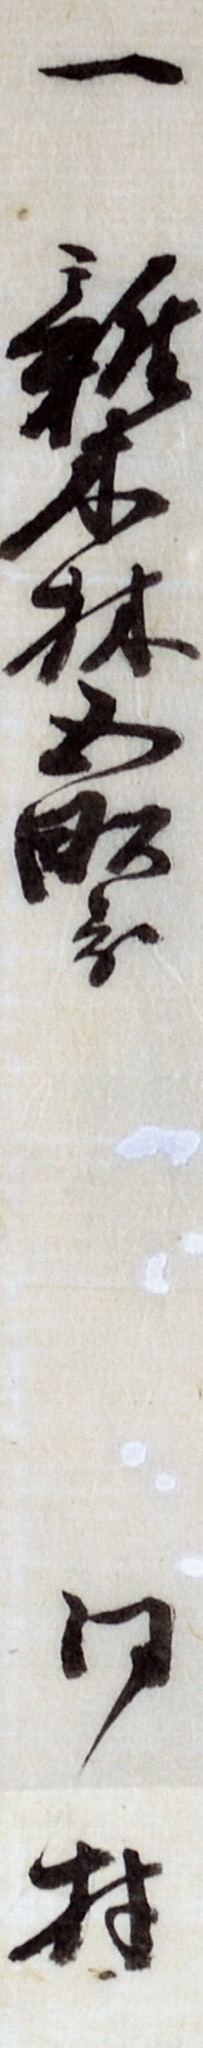一雑木林五畝歩同村
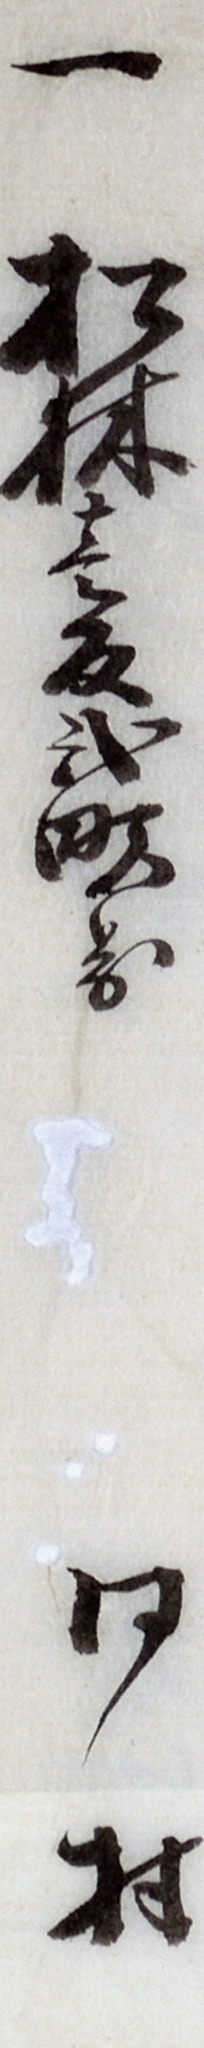一松林壱反弐畝歩同村
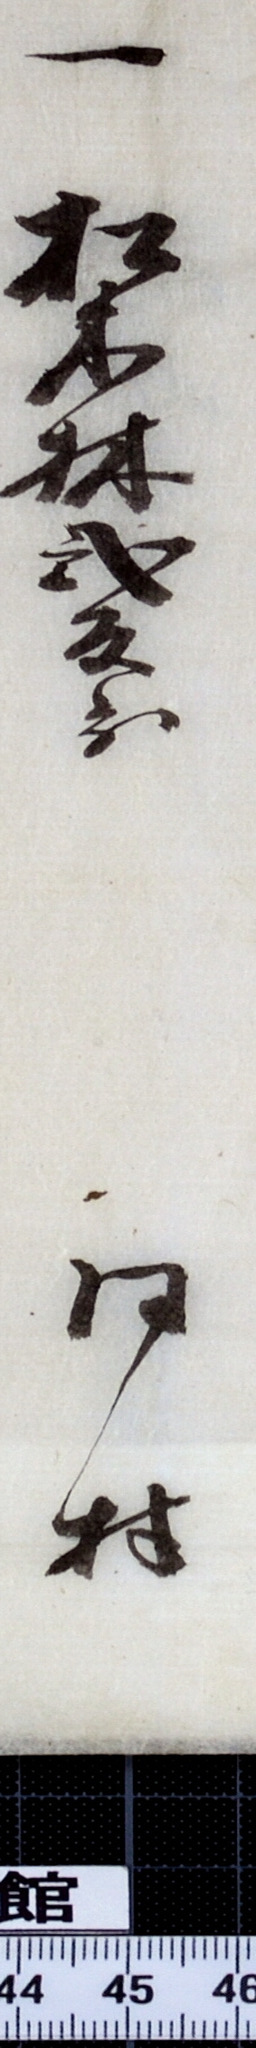一松木林弐反歩同村
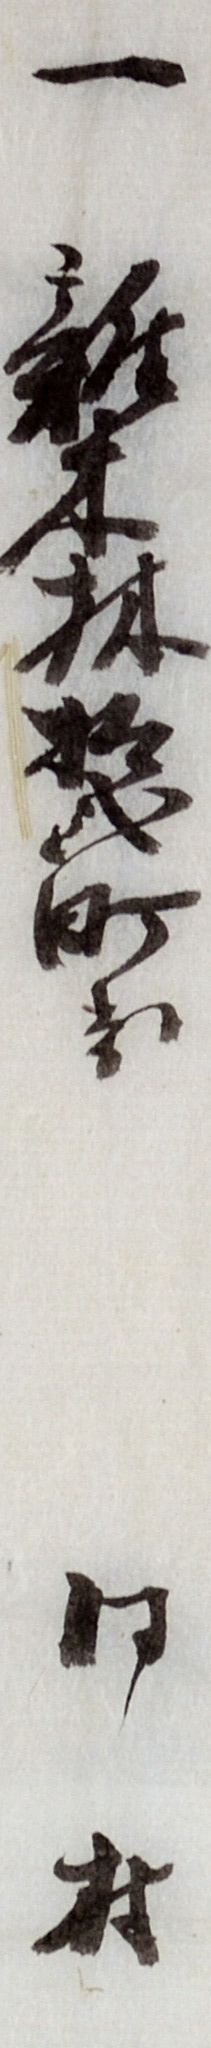一雑木林拾弐町歩同村
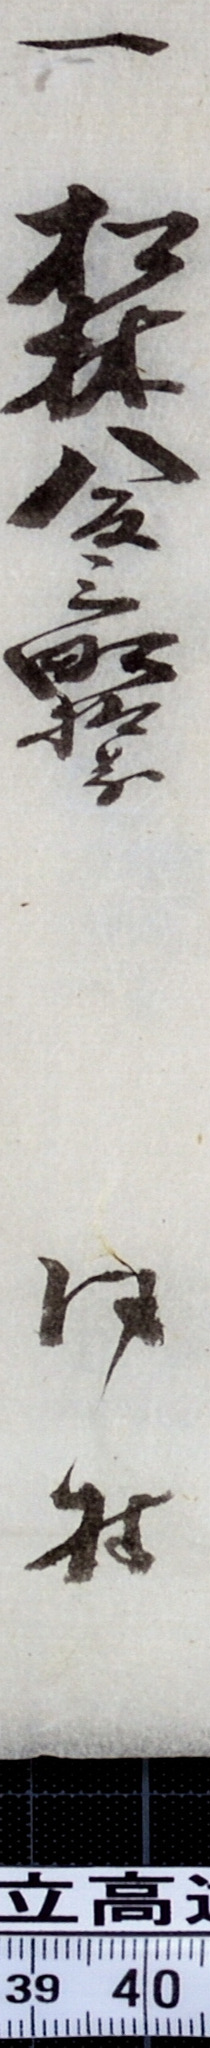一松林八反三畝拾歩同村
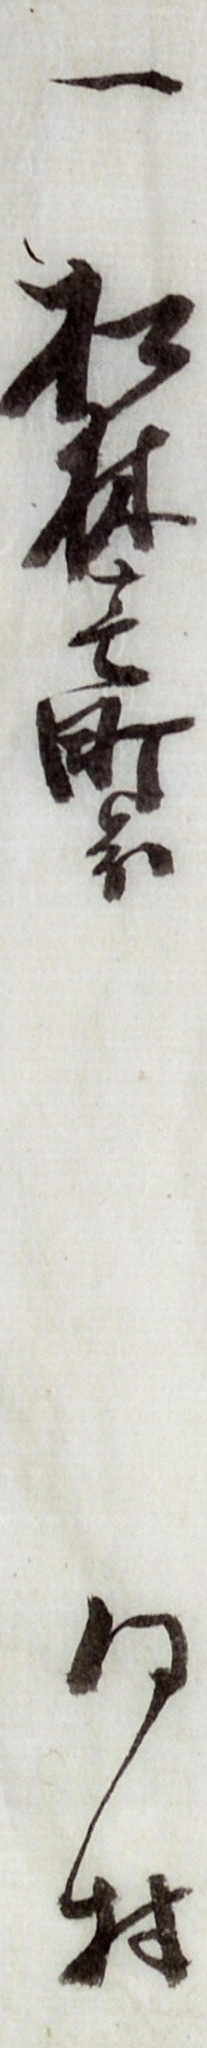一松林壱町歩同村
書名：御山林帳
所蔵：伊那市立高遠町図書館・合同会社AMANE
